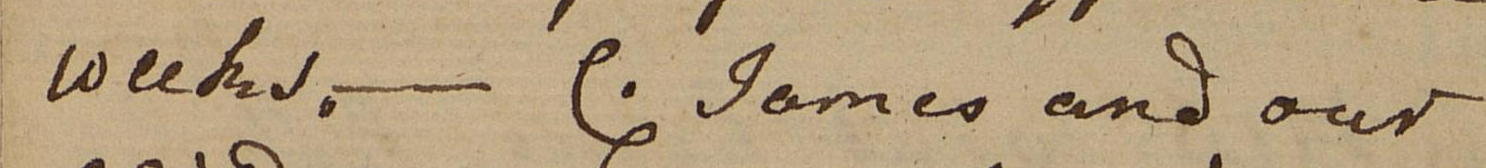weeks.- C. James and our
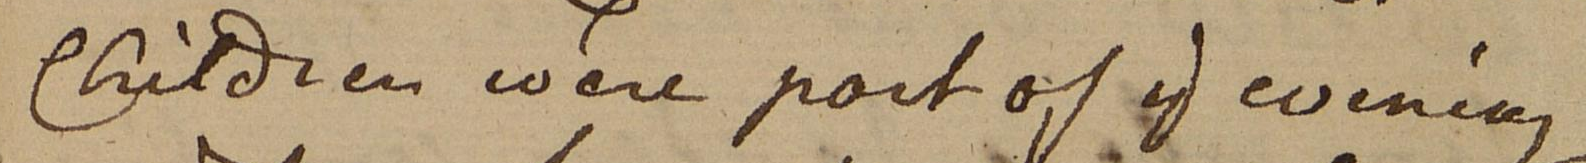Children were part of y^e evening
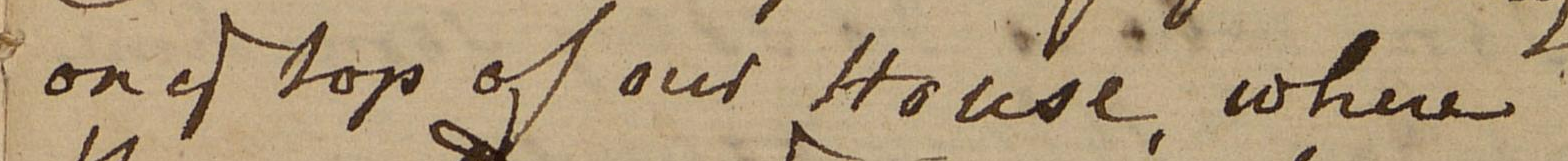on y^e top of out House, where
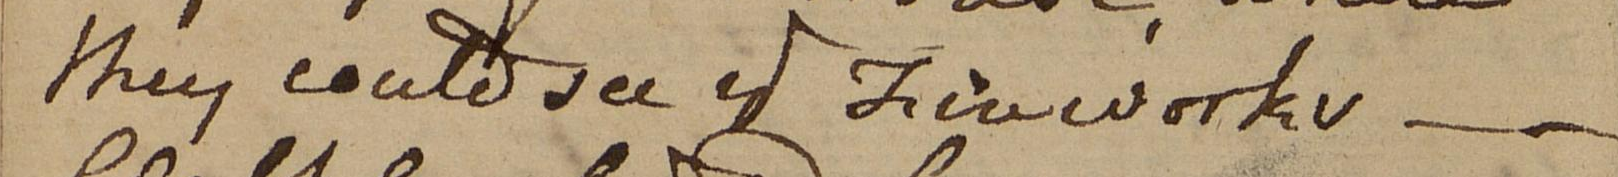they could see y^e Fireworks-
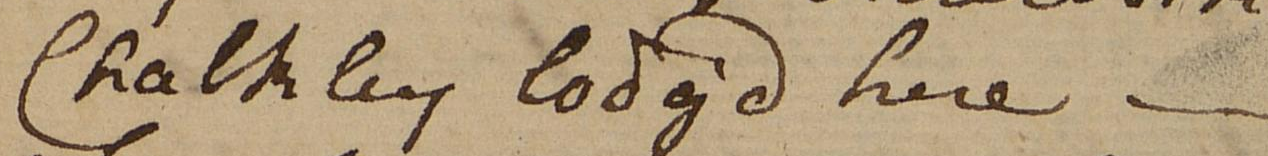Chalkley lodg'd here-
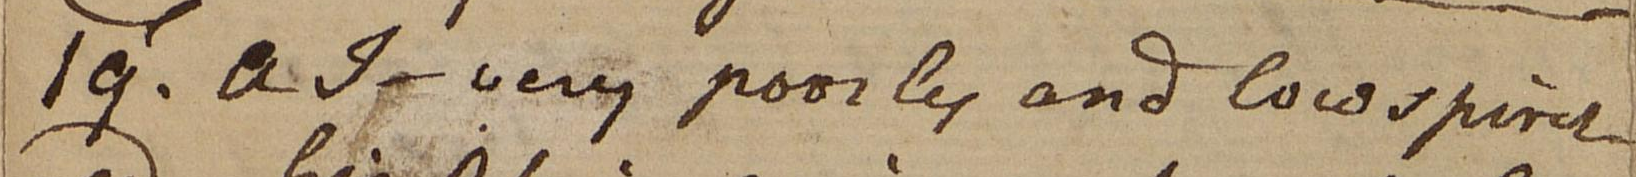19. AJ- very poorly and low spirit
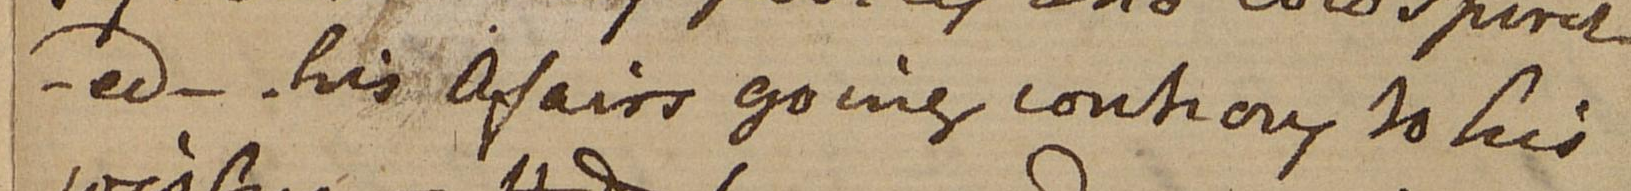-ed- his Afairs going contrary to his
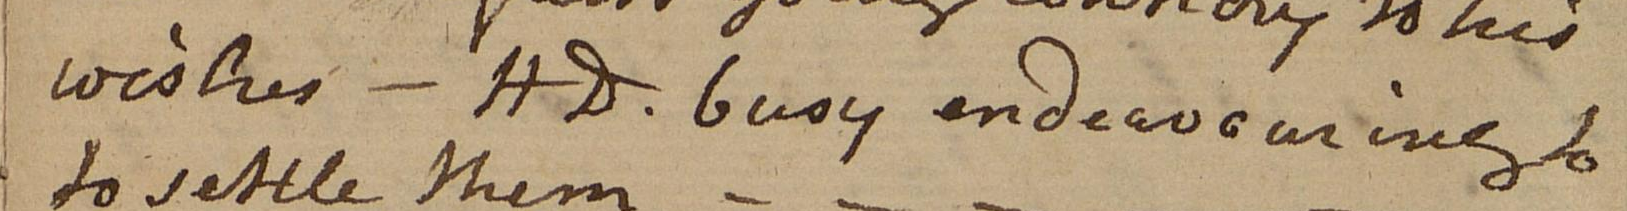wishes- HD. busy endeavouring to
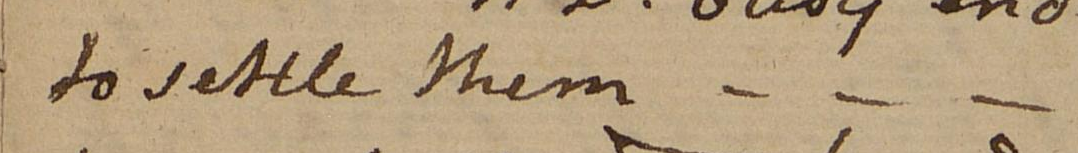to settle them---
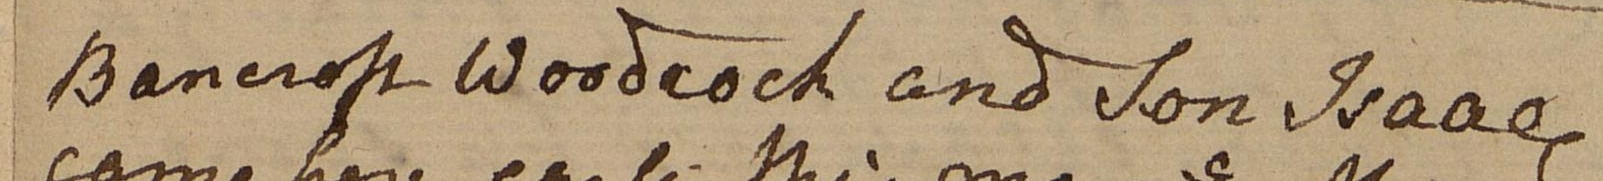Bancroft Wordcock and Son Isaac
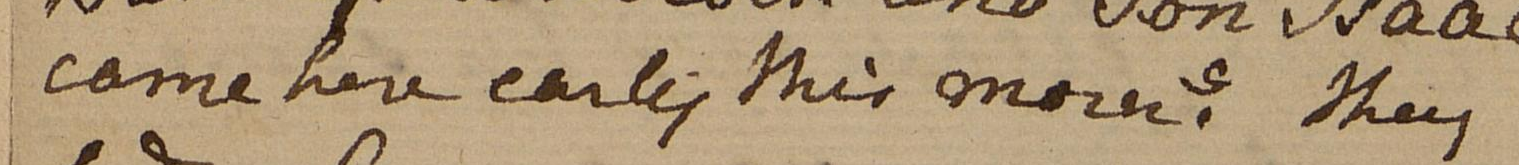came here early this morn^g. they
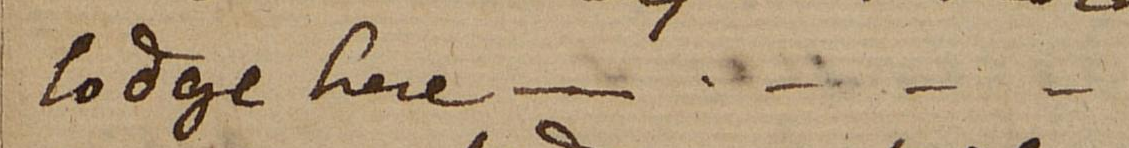lodge here-.
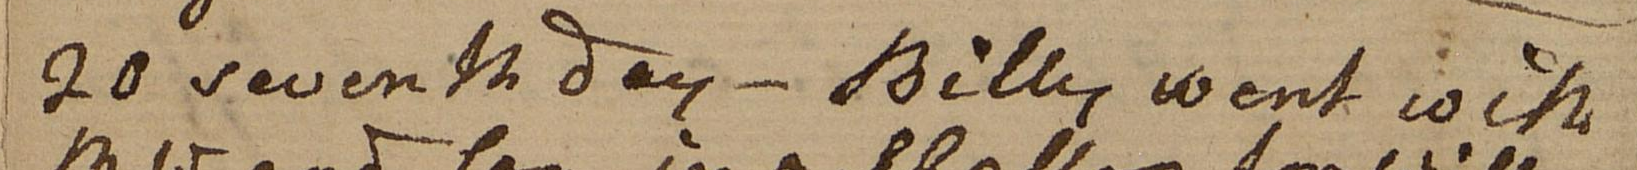20 seventh day- Billy went with
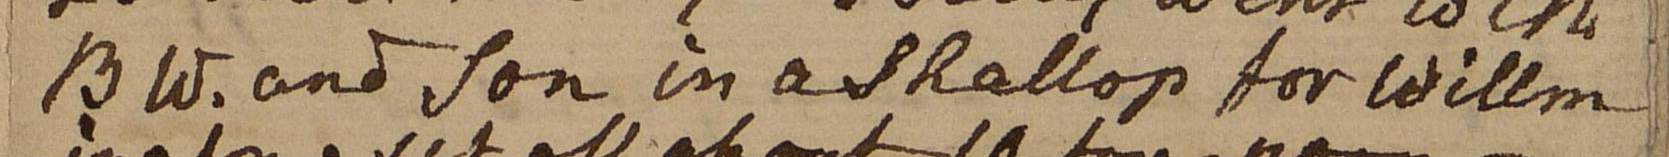B W. and son in a Shallop for Willm
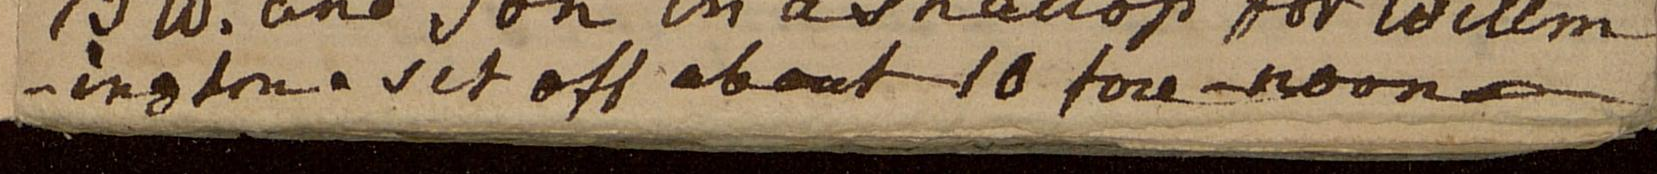-ington. set off about 10 fore-noon-
